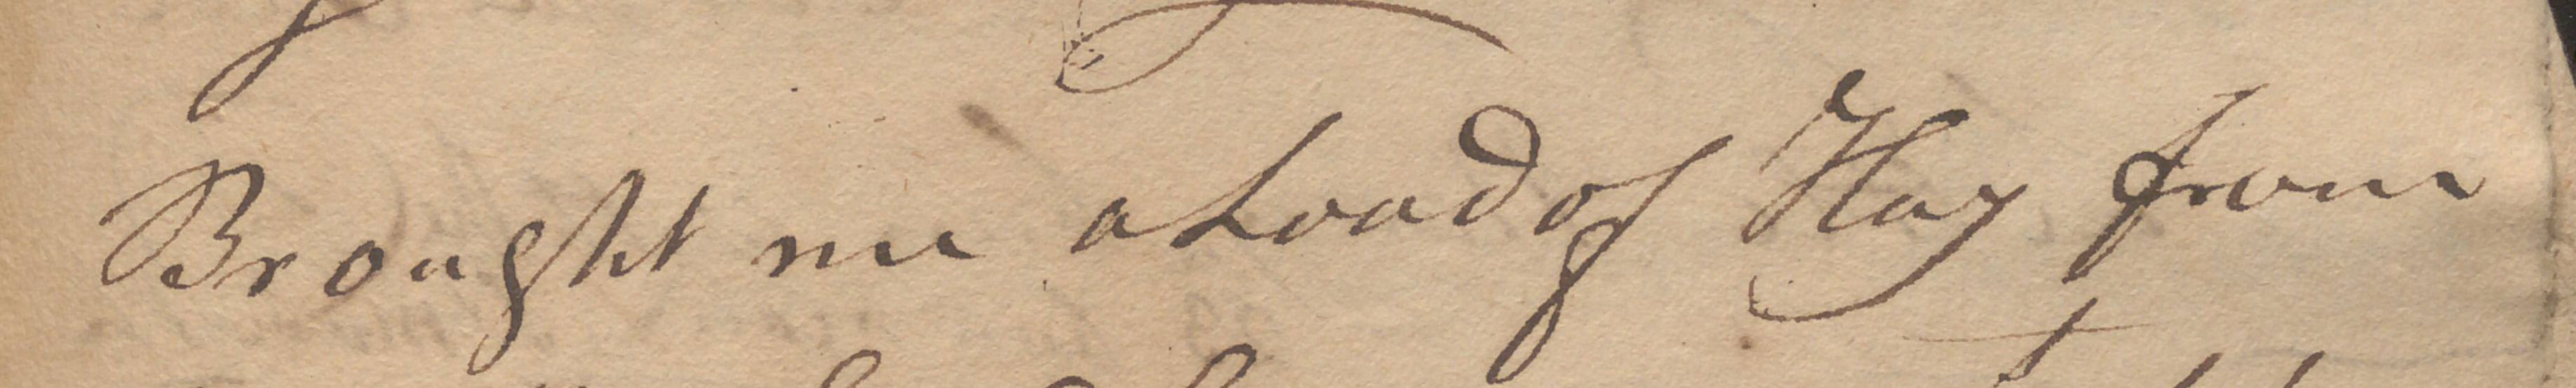Brought me a Load of Hay from
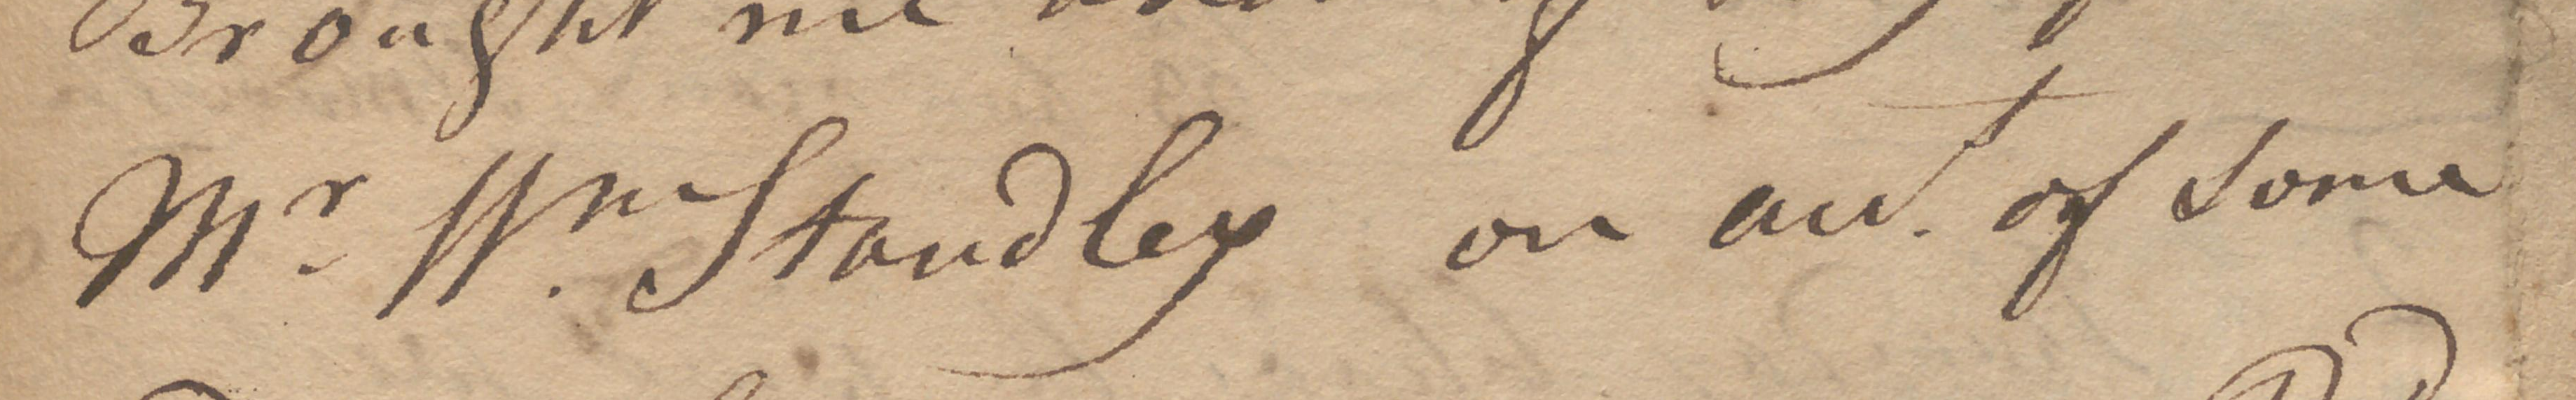M^r. W^m. Staudley, on acc^t. of some
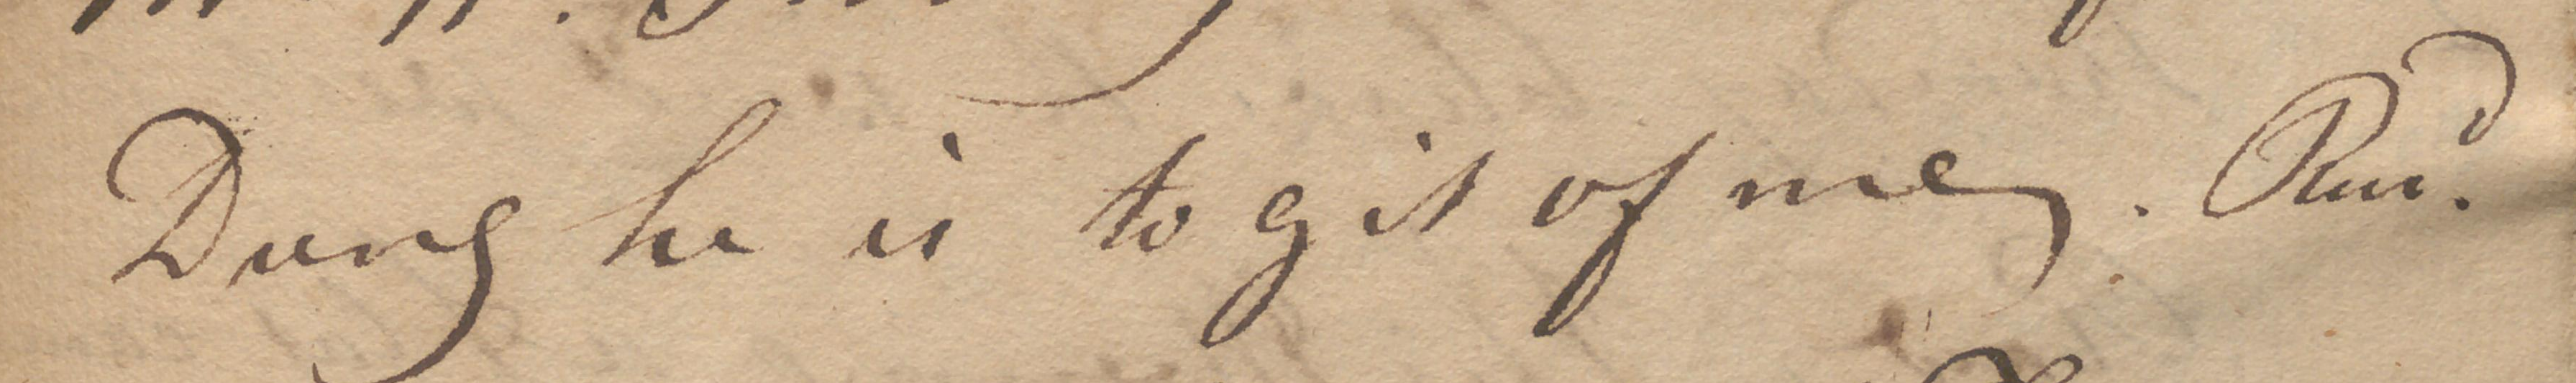Dung he is to git of me. Rec^d.
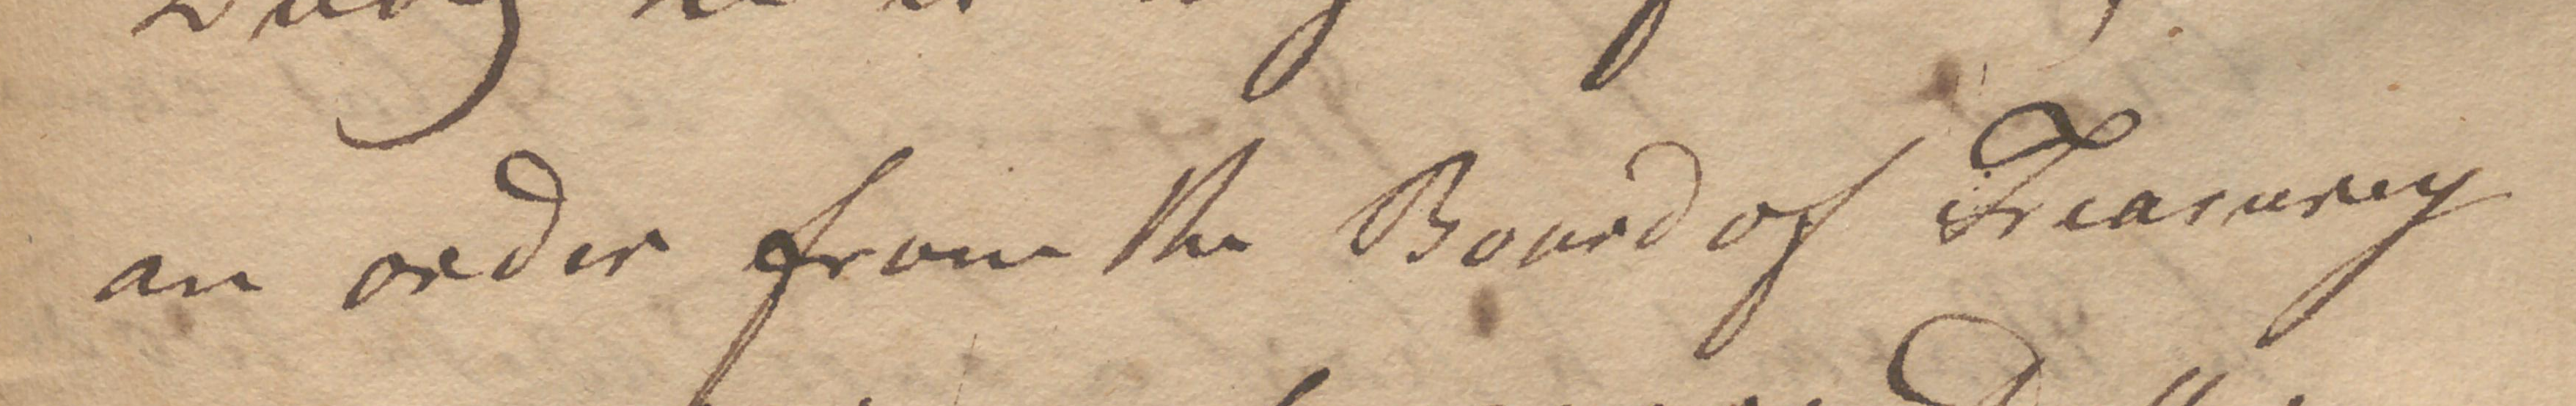are order from the Board of Treasurey
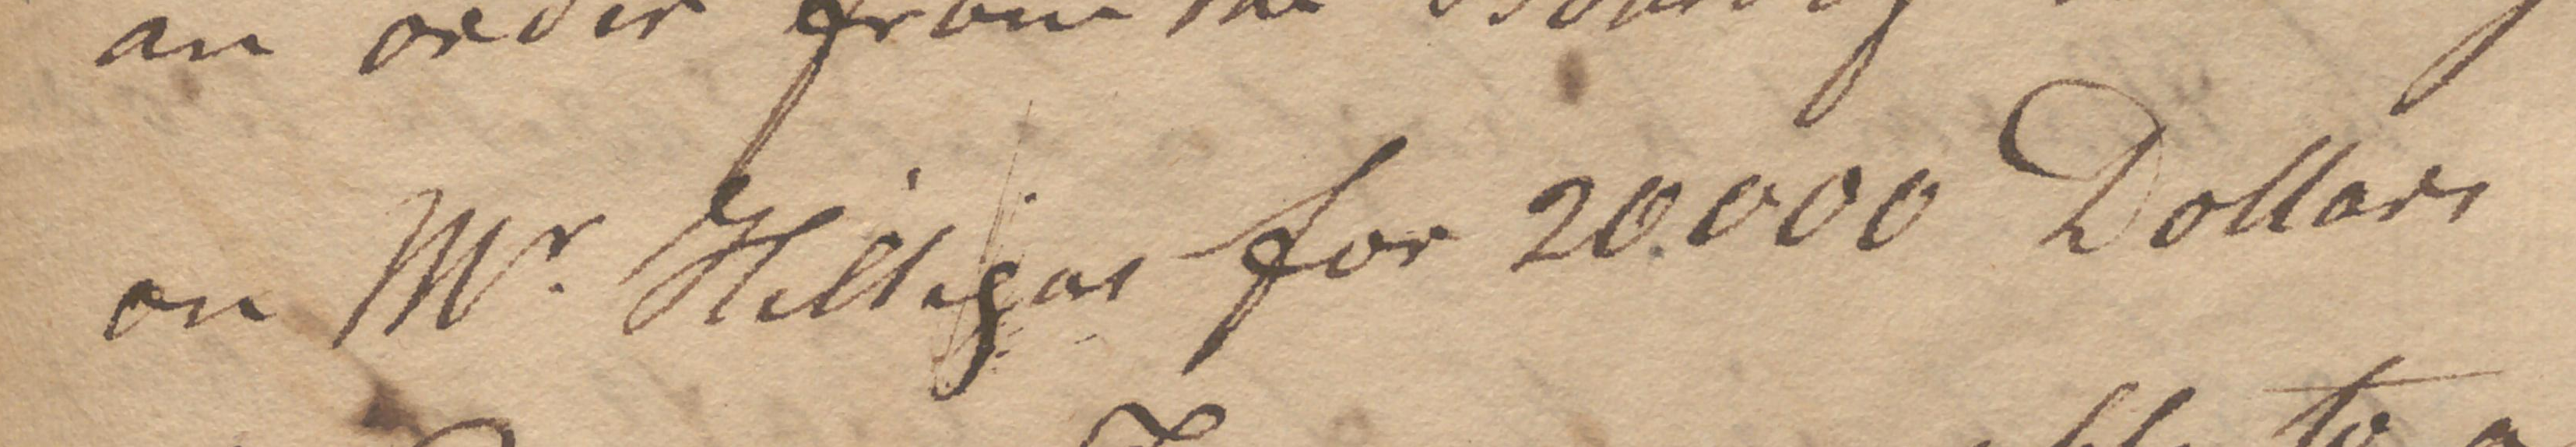on M^r. Hilligas for 20000 Dollars
